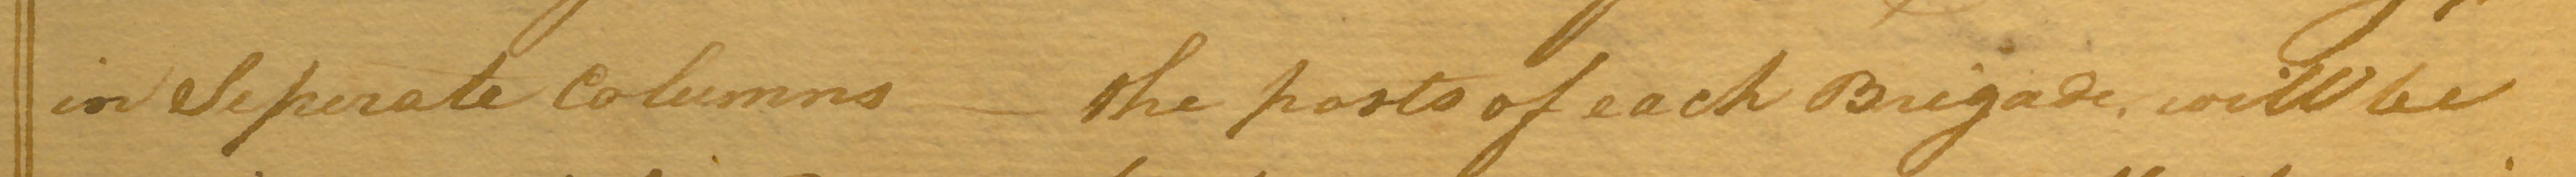in Separate Columns- the parts of each Brigade will be
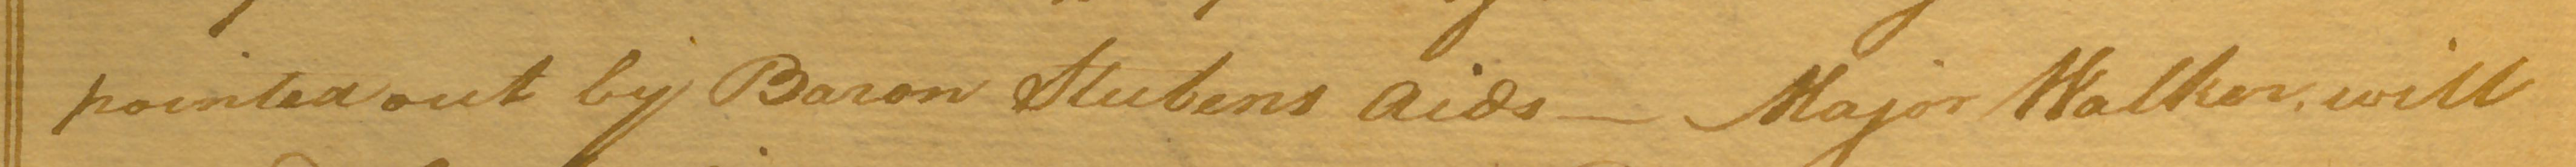pointed out by Baron Stubens Aids- Major Walker will
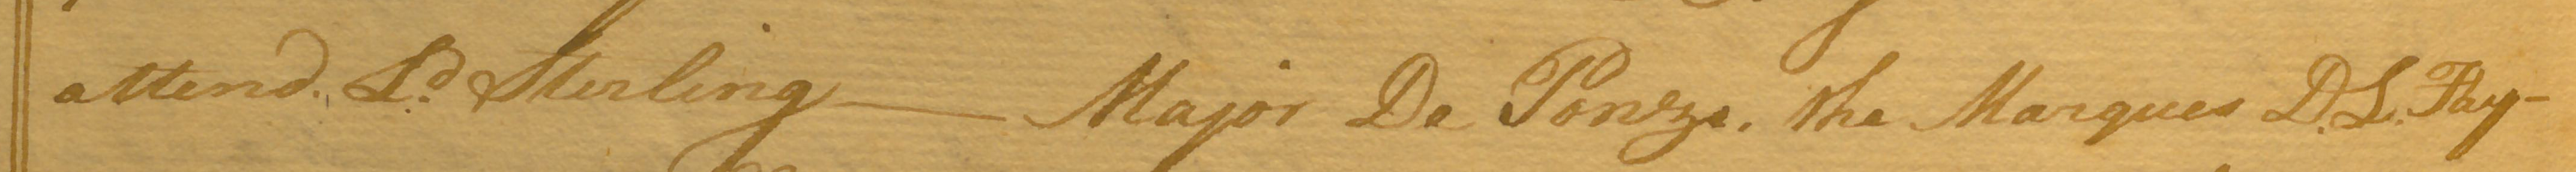attend L^d. Sterling- Major De Ponze the Marques D. L. Fay-
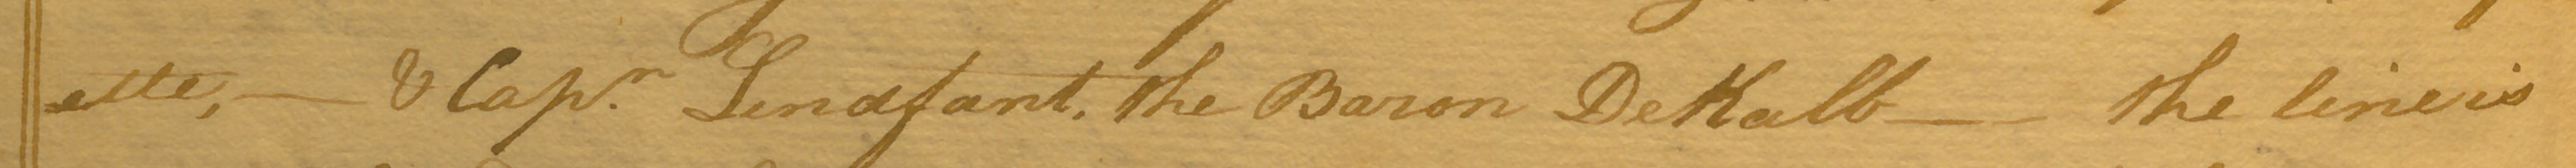ette,- & Cap^n. Lendfant, the Baron DeKalb- the line is
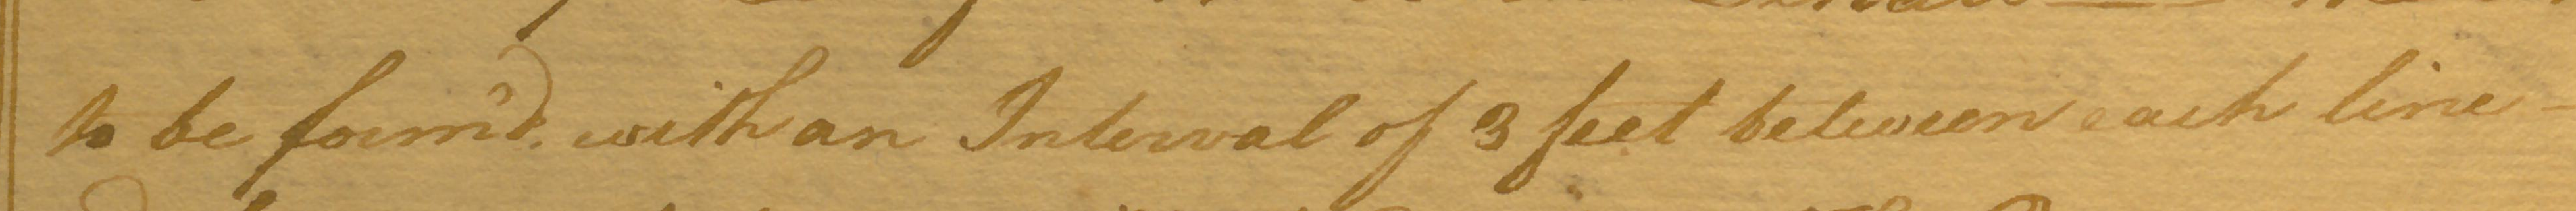to be form'd with an Interval of 3 feet between each line
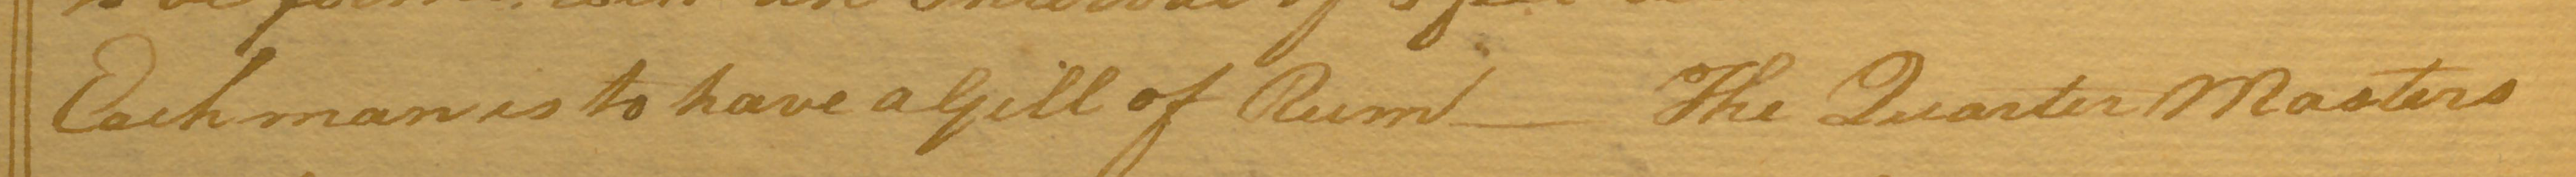Each man is to have a Gill of Rum- The Quarter Masters
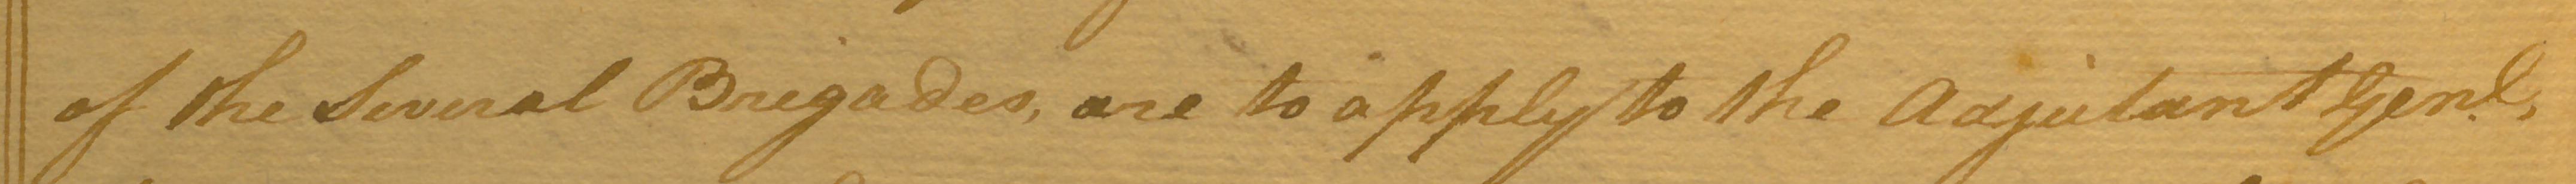of the Several Brigades are to apply to the Adjutant Gen^l.,
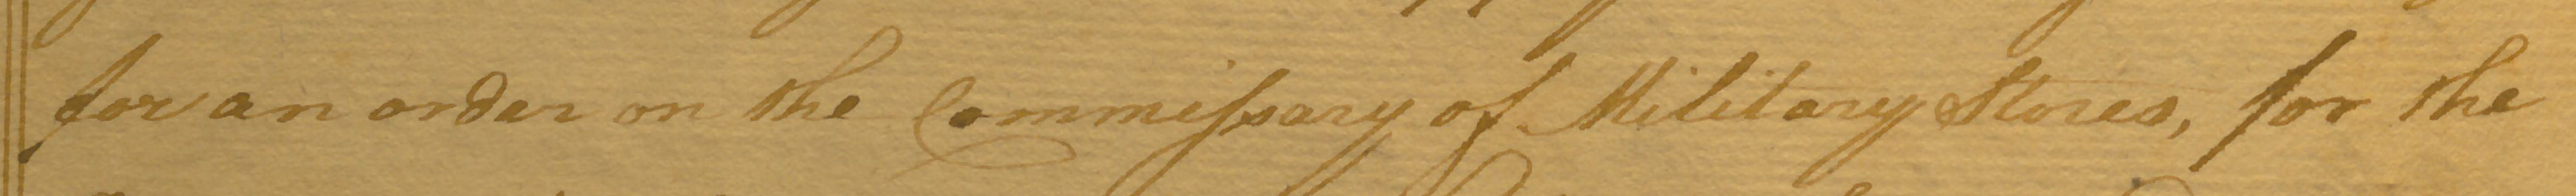for an order on the Commissary of Military Stores, for the
